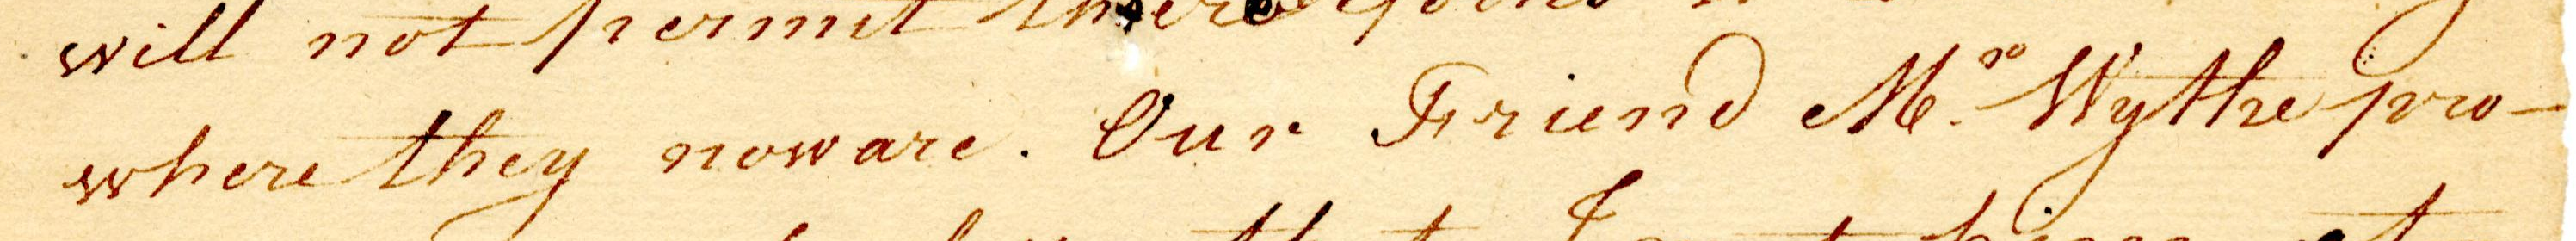where they now are. Our Friend M^r. Wythe pro-
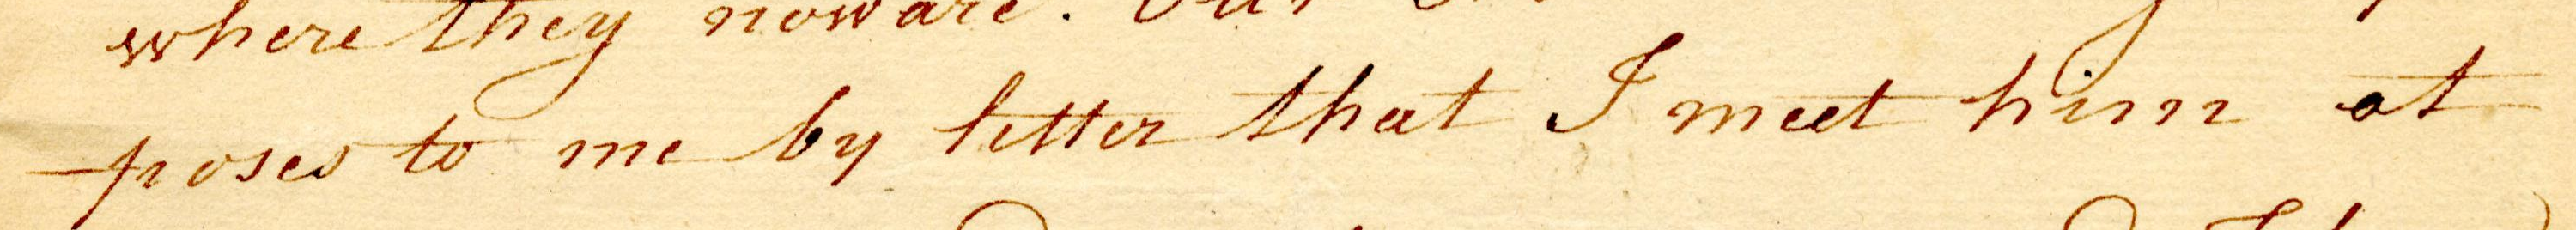-poses to me by letter that I meet him at
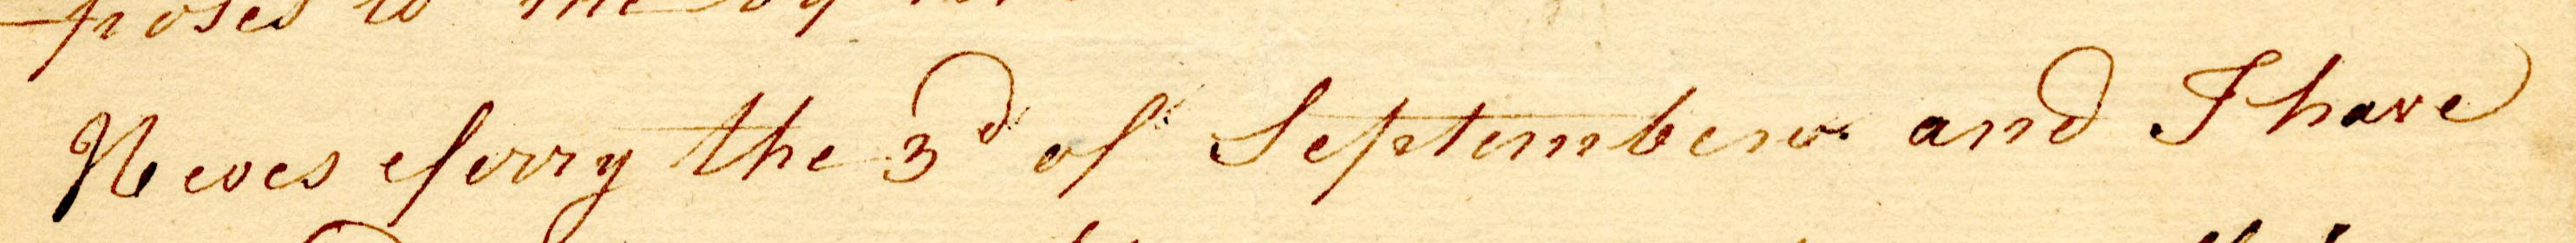Neves ferry the 3^d of September and I have
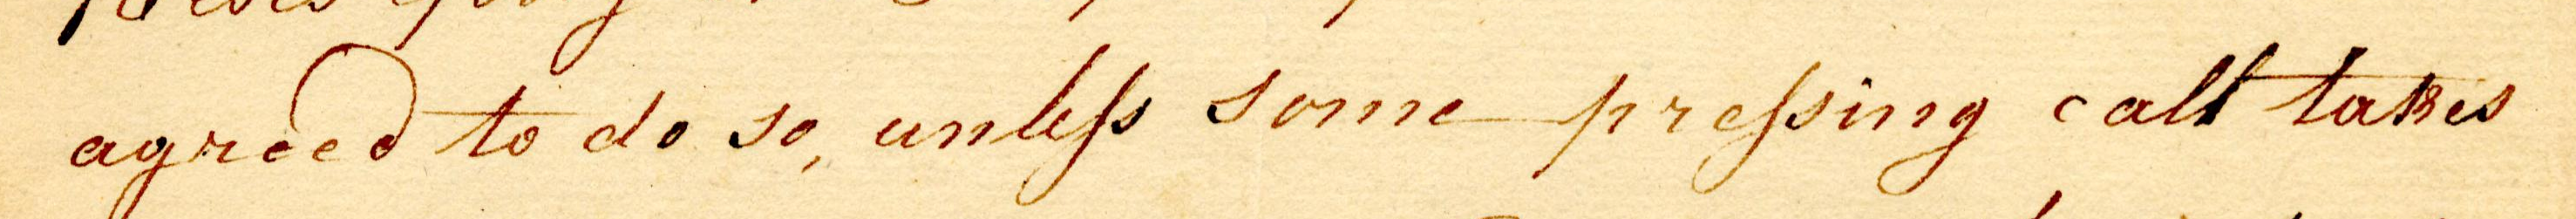agreed to do so, unless some pressing call takes
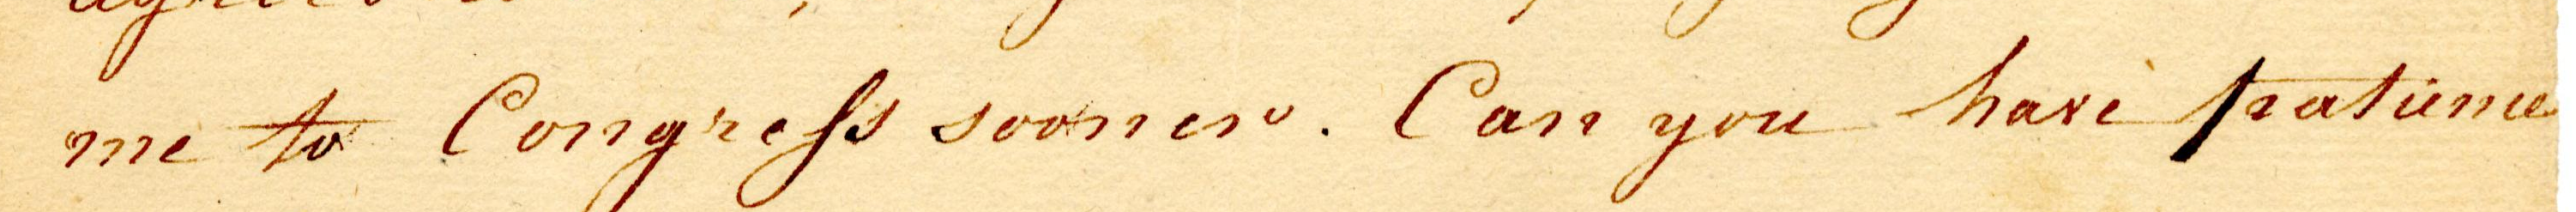me to Congress sooner. Can you have patience
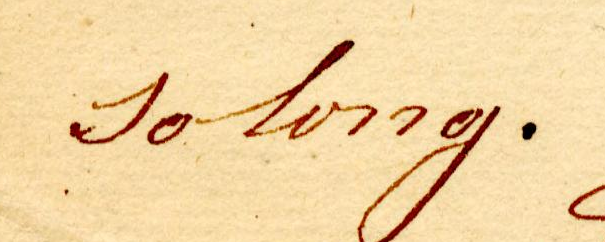so long.
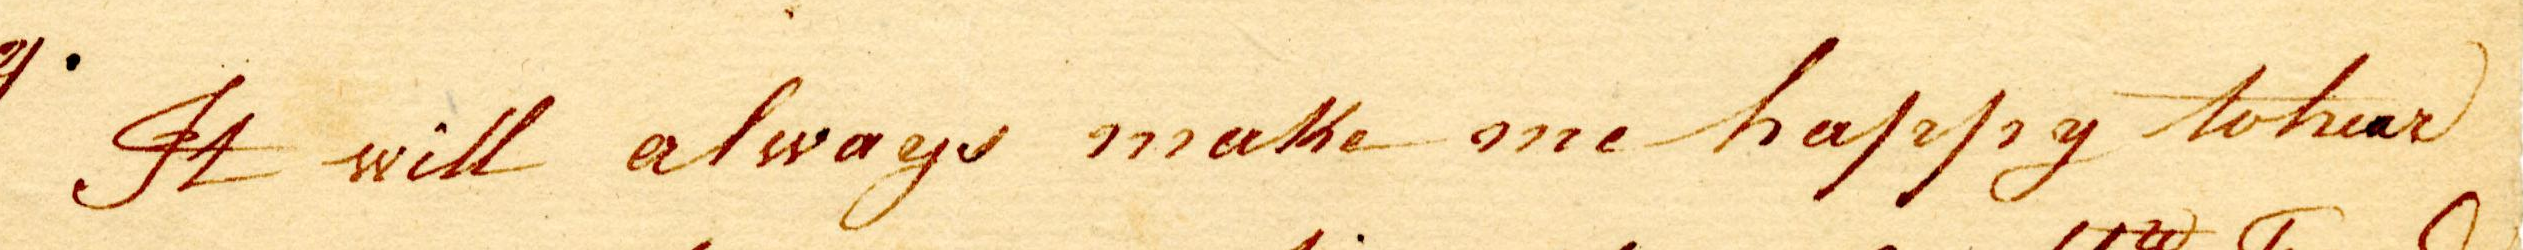It will always make me happy to hear
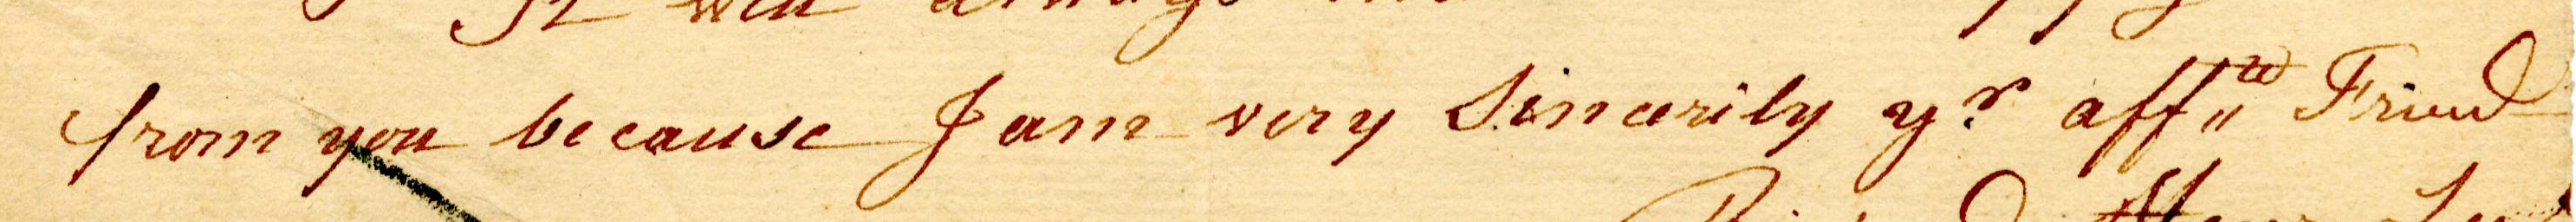from you because I am very sincerily y^r. aff^ti a. Friend
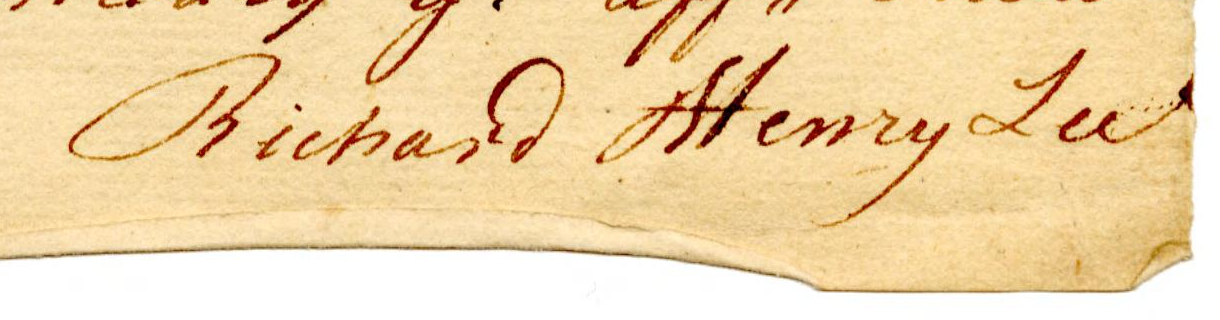Richard Henry Lee
